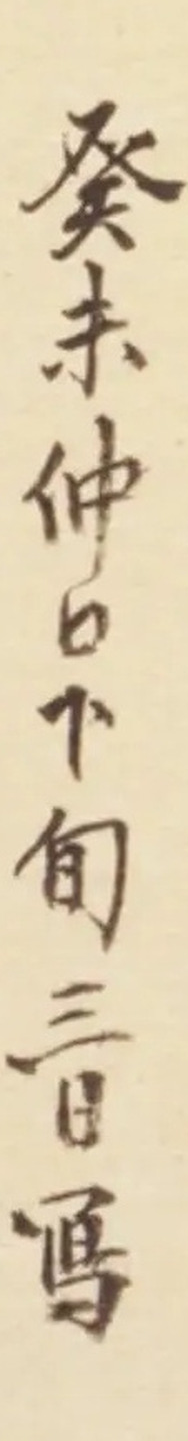癸未仲呂下旬三日寫
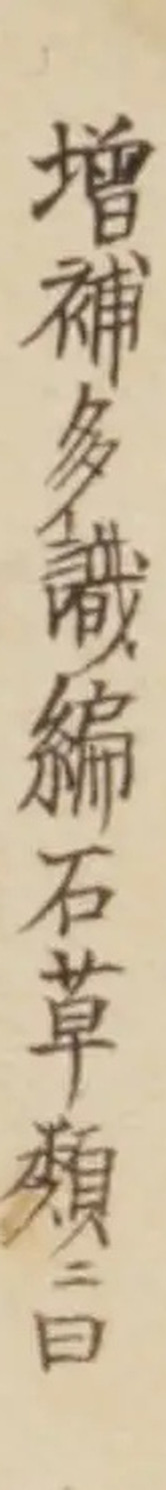増補多識編石草類に曰

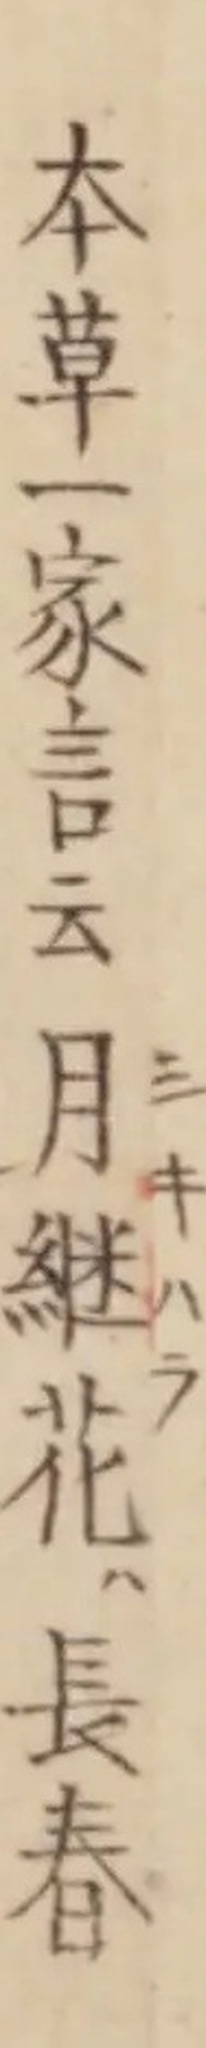本草一家言云月継花は長春
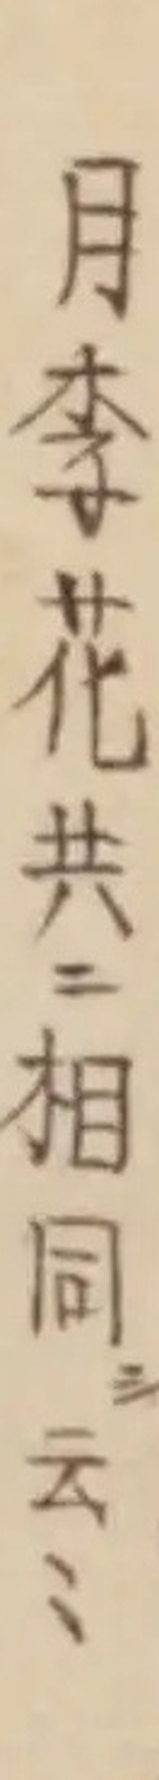月李花共に相同し云々
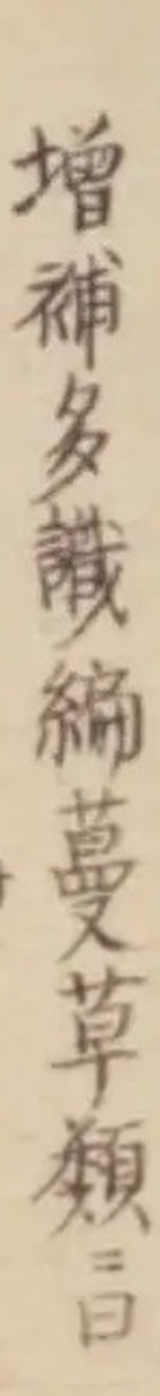増補多識編蔓草類に曰
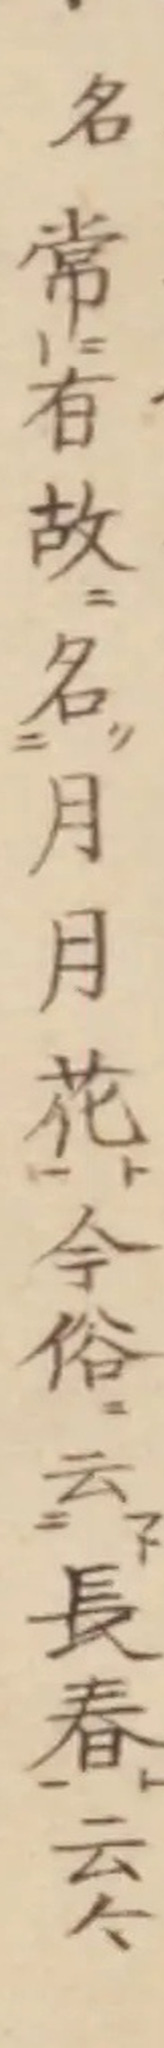名常に有故に名く月月花と今俗に云ふと長春と云々
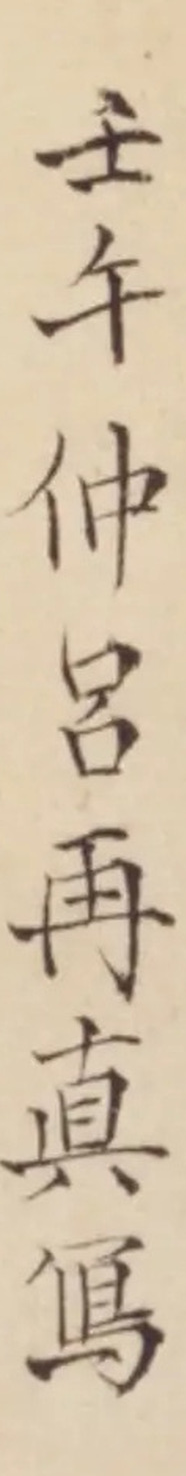壬午仲呂再真寫
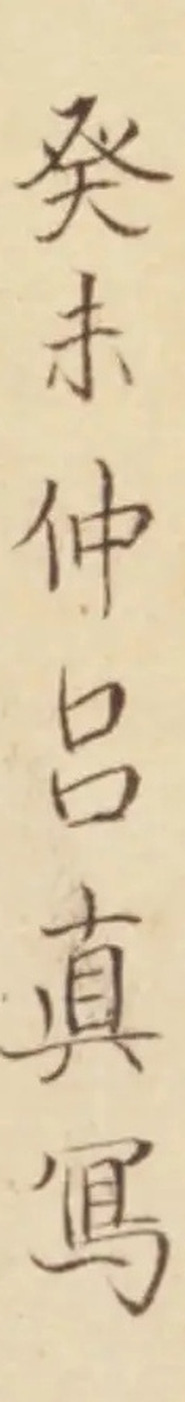癸未仲呂真寫

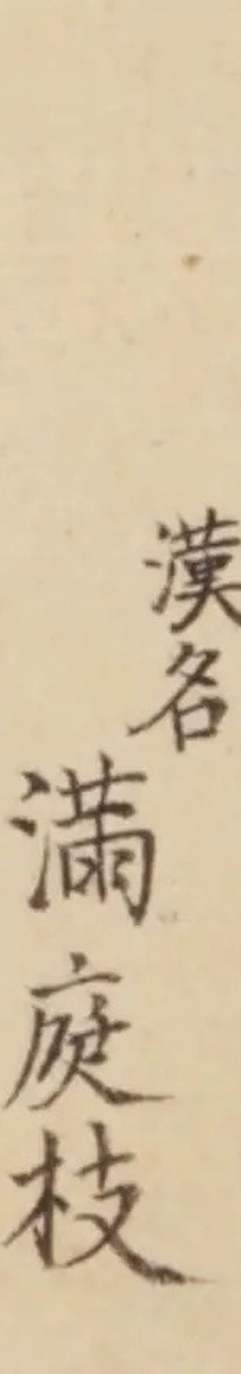満庭枝
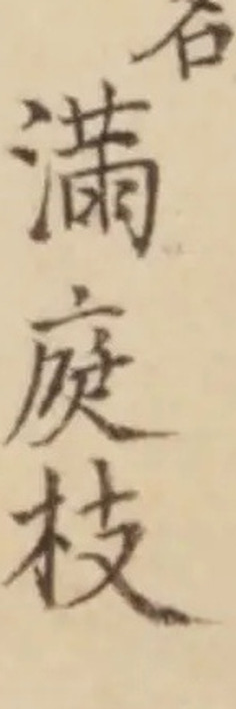満庭枝
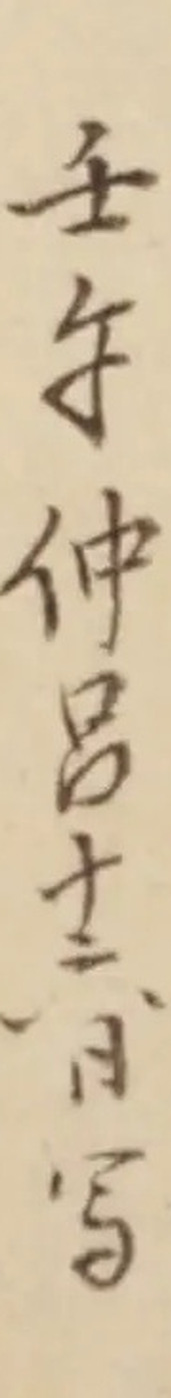壬午仲呂十二日写
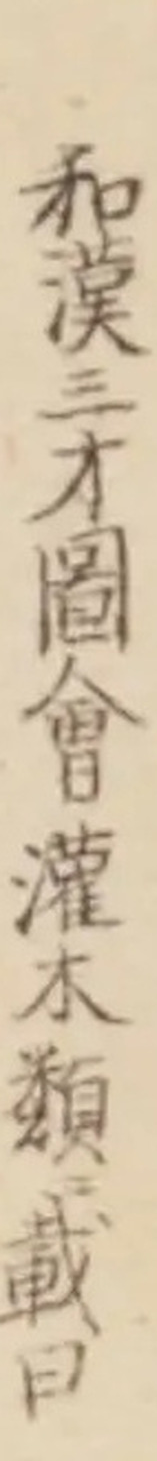和漢三才圖會灌木類に載曰
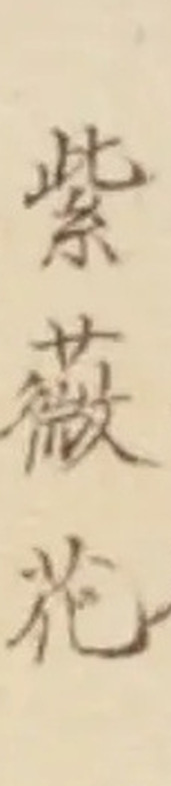紫薇花
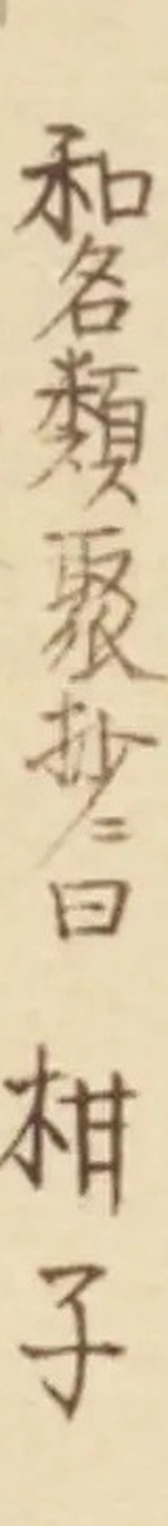和名類聚抄に曰柑子
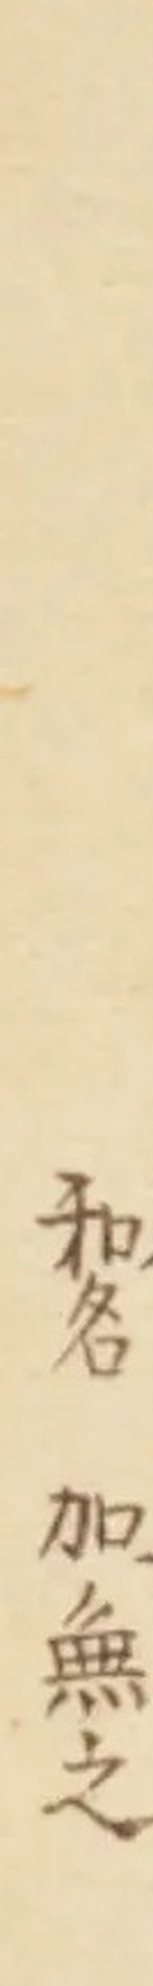和名加魚之
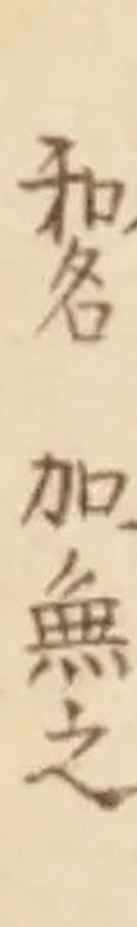和名加魚之
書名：梅園草木花譜夏之部. 1
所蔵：国立国会図書館 National Diet Library, JAPAN
